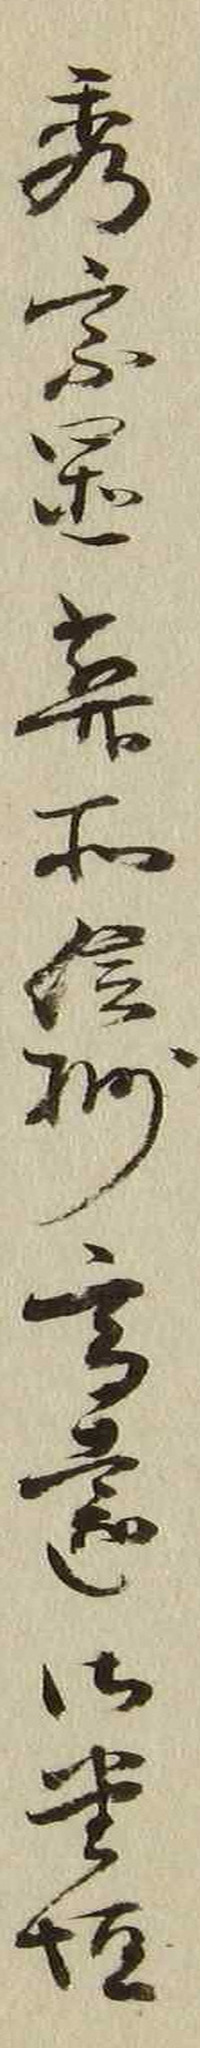秀宗置葬所信州高遠御堂垣
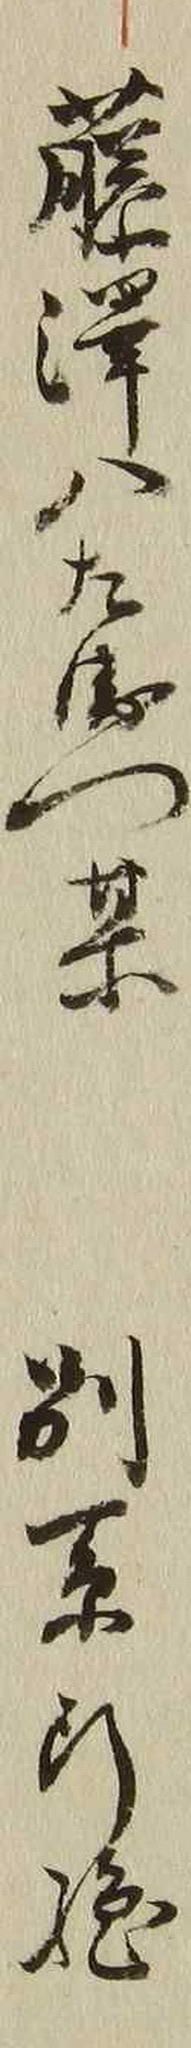藤沢八左衛門某別系断絶
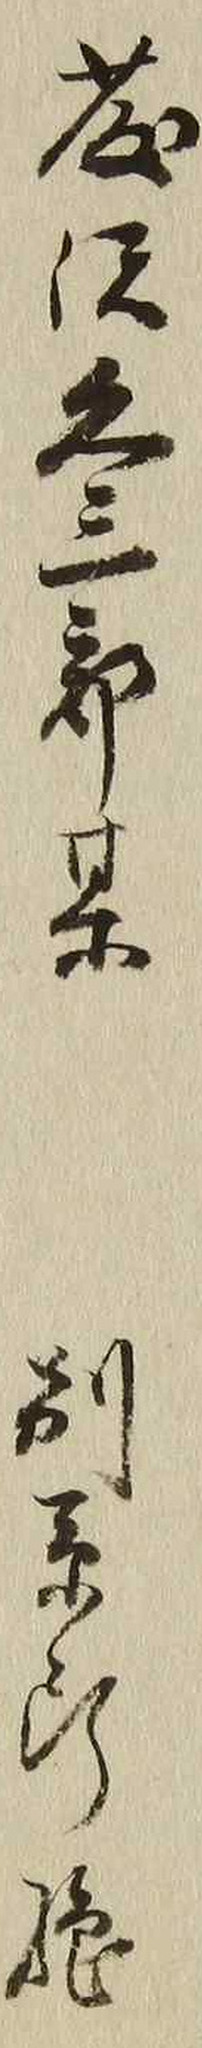藤沢久三郎某別系断絶
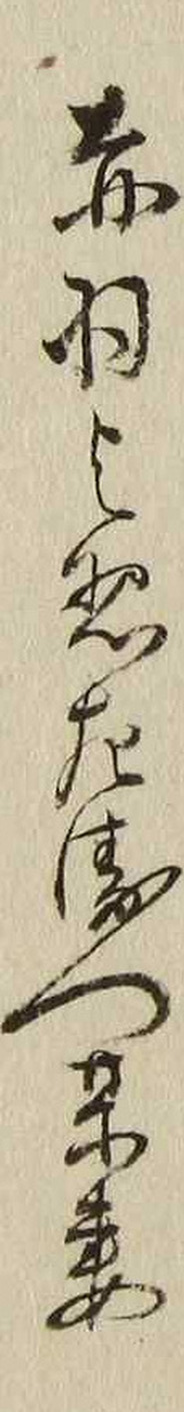女赤羽与惣左衛門某妻
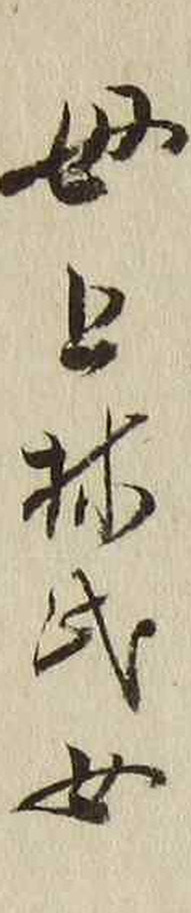母上林氏女
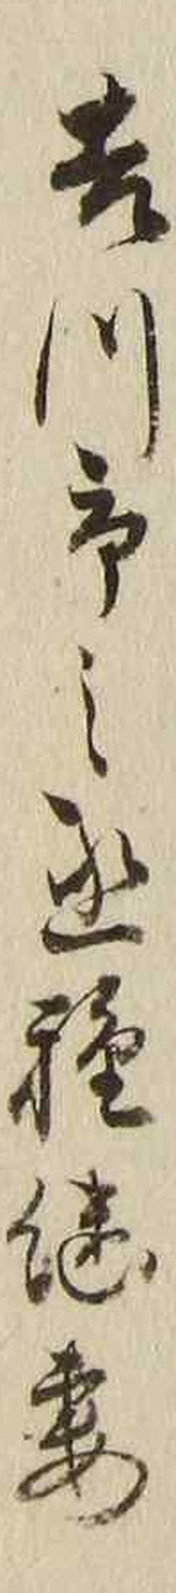女吉川市之丞種継妻

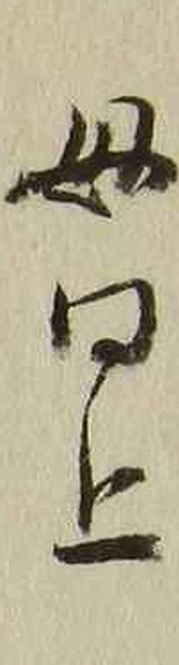母同上
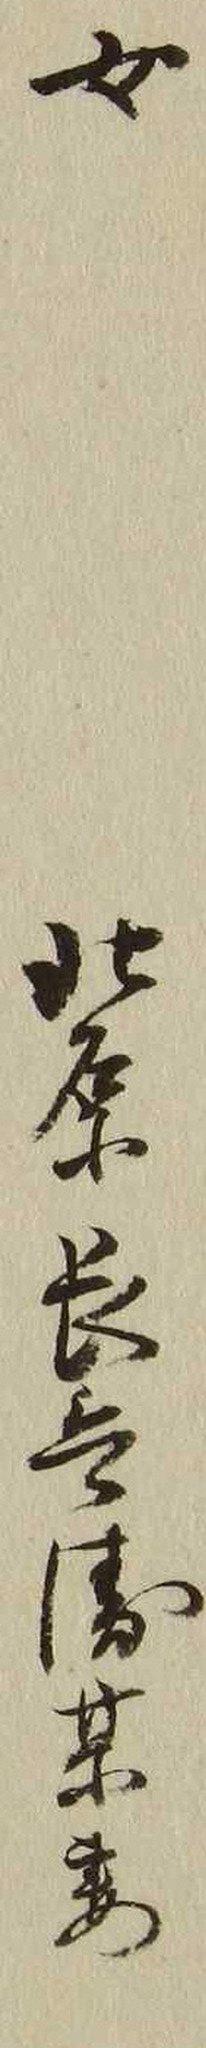女北原長兵衛某妻
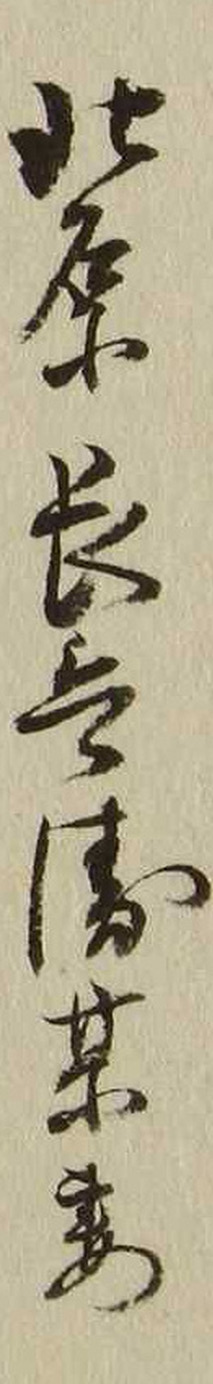女北原長兵衛某妻
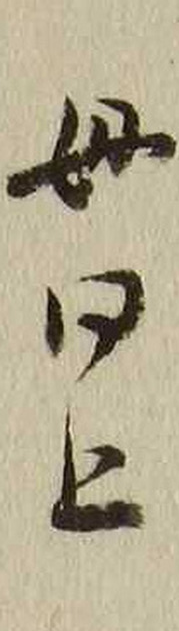母同上
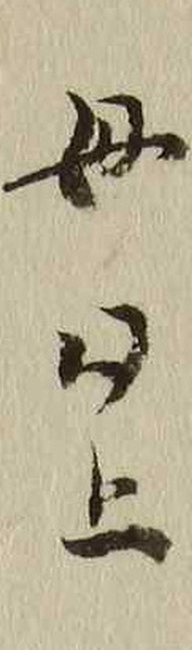母同上
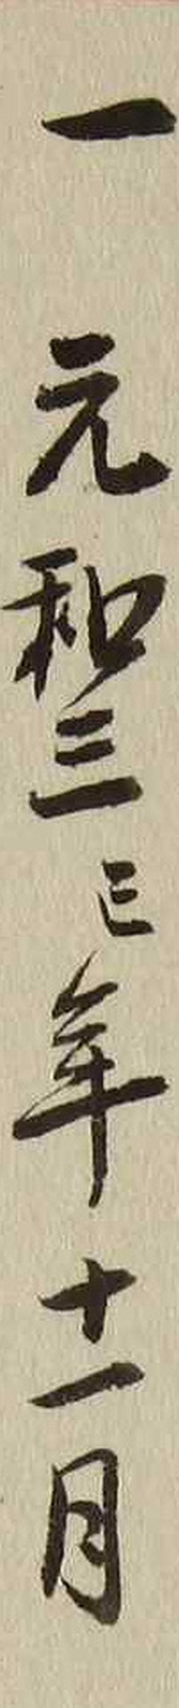一元和三巳年十一月
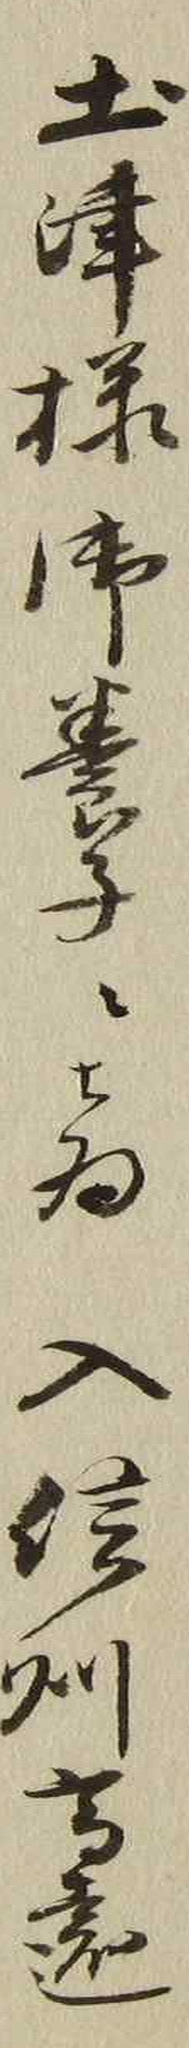土津様御養子ニ被為入信州高遠
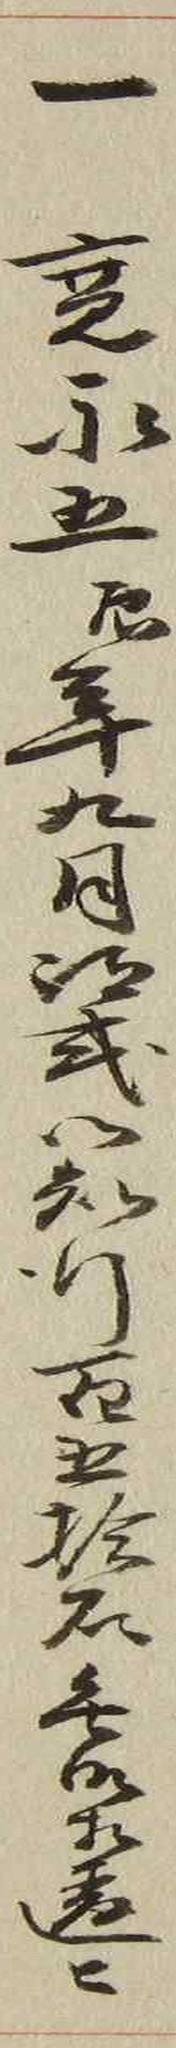一寛永五辰年九月跡式御知行百五拾石無御相違被
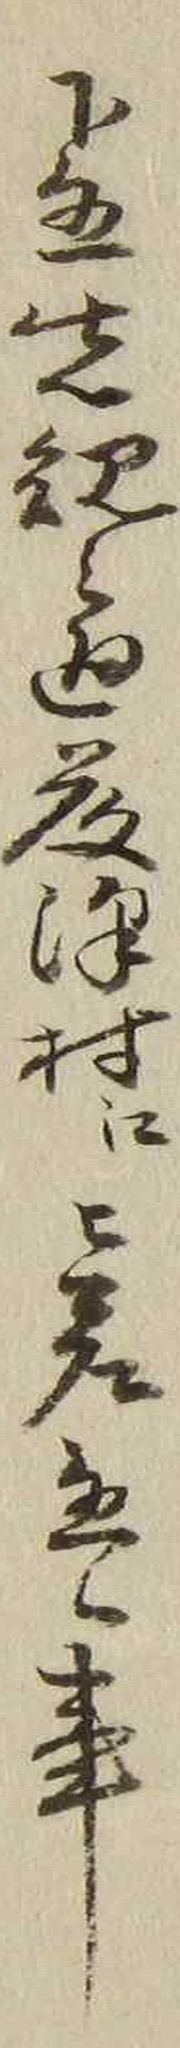下置先規之通藤沢村江被差置候事
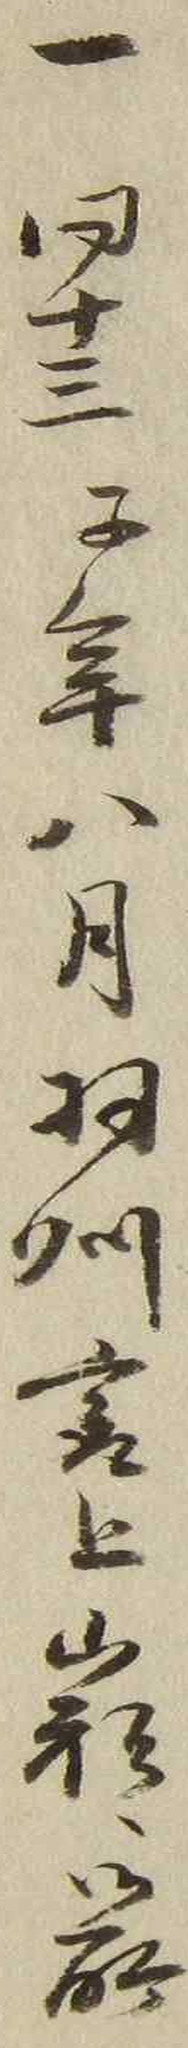一同十三子年八月羽州最上山形へ御所
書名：諸士系譜　巻之236　ふ之部4
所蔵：会津若松市立会津図書館
